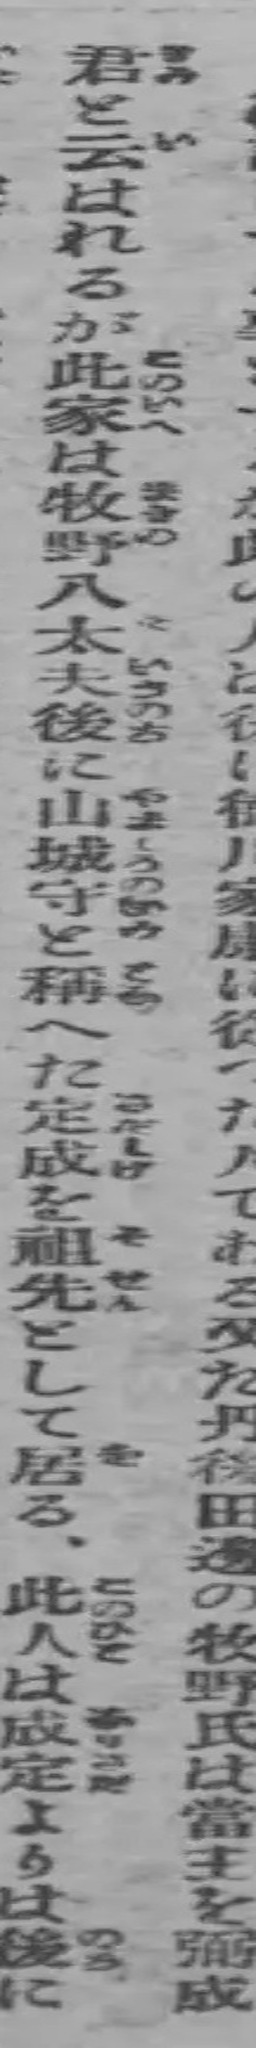君と云はれるが此家は牧野八太夫後に山城守と称へた定成を祖先として居る、此人は成定よりは後に
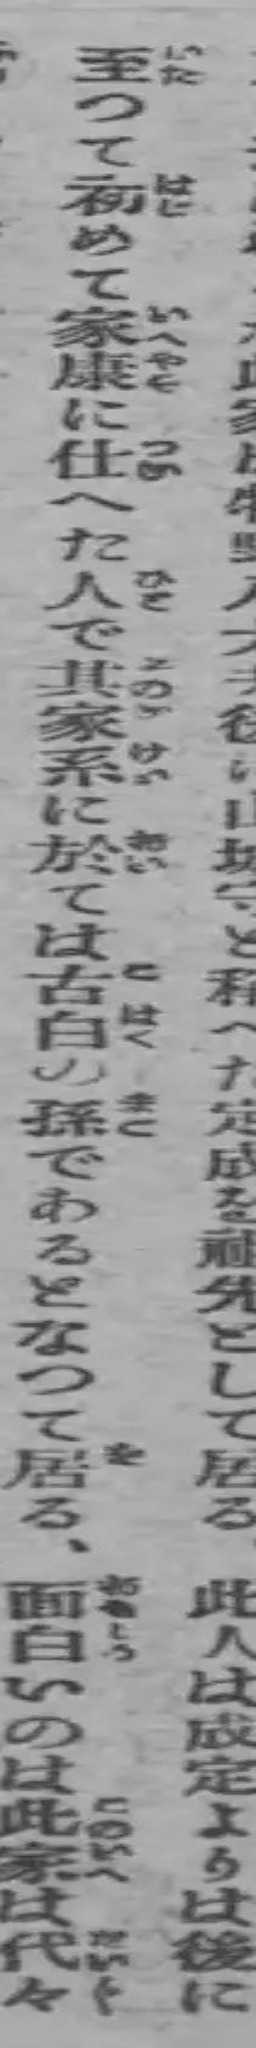至つて初めて家康に仕へた人で其家系に於ては古白の孫であるとなつて居る、面白いのは此家は代々
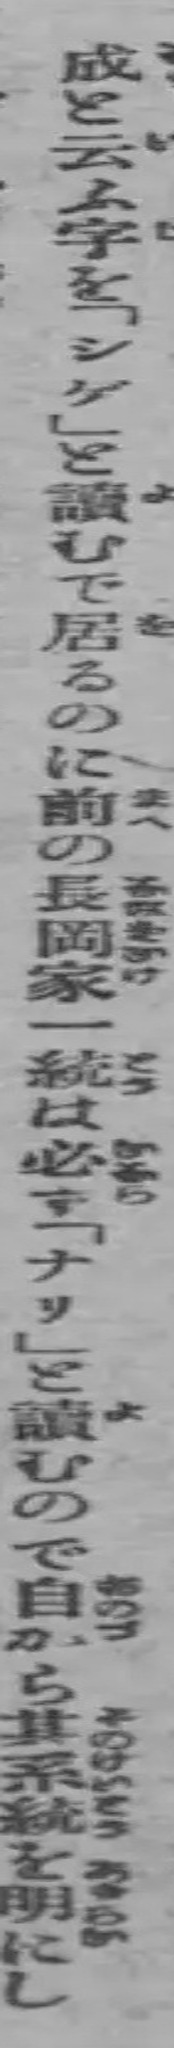成と云ふ字を「シゲ」と読むで居るのに前の長岡家一統は必ず「ナリ」と読むので自から其系統を明にし
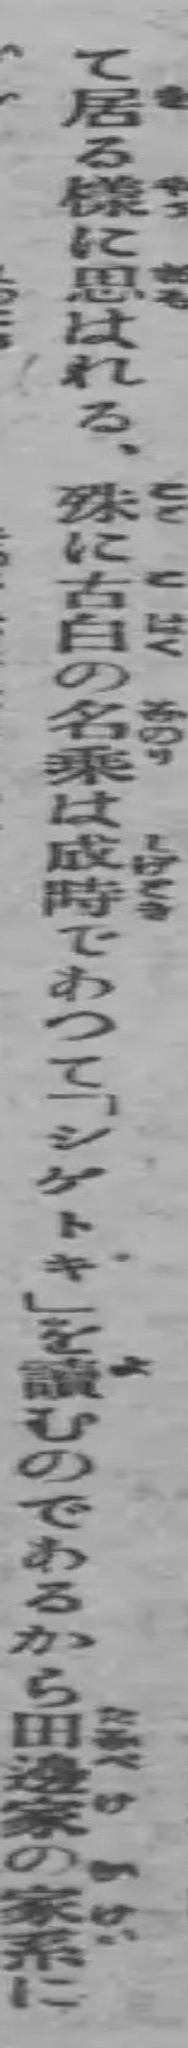て居る様に思はれる、殊に古白の名乗は成時であつて「シゲトキ」を読むのであるから田辺家の家系に
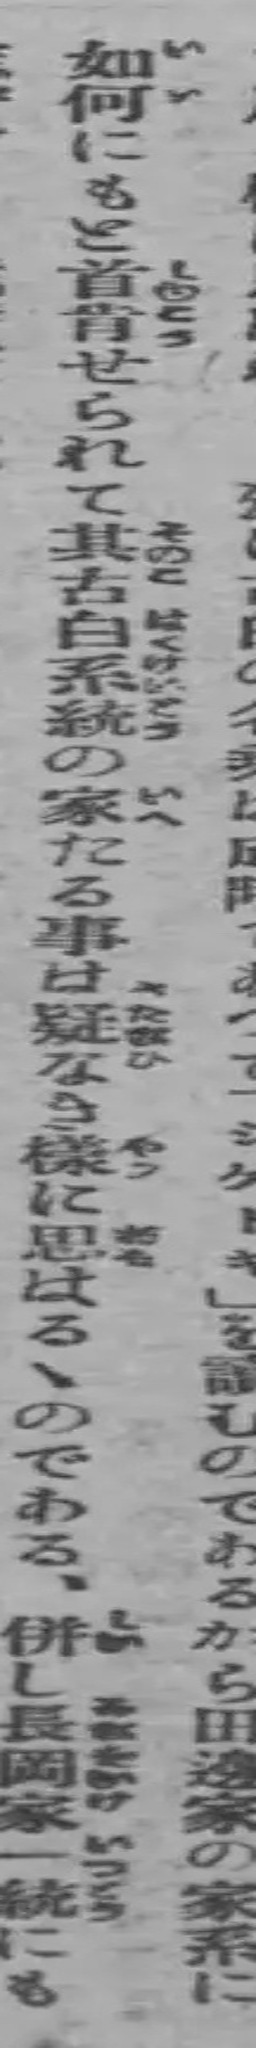如何にもと首肯せられて其古白系統の家たる事は疑なき様に思はるゝのである、併し長岡家一統にも
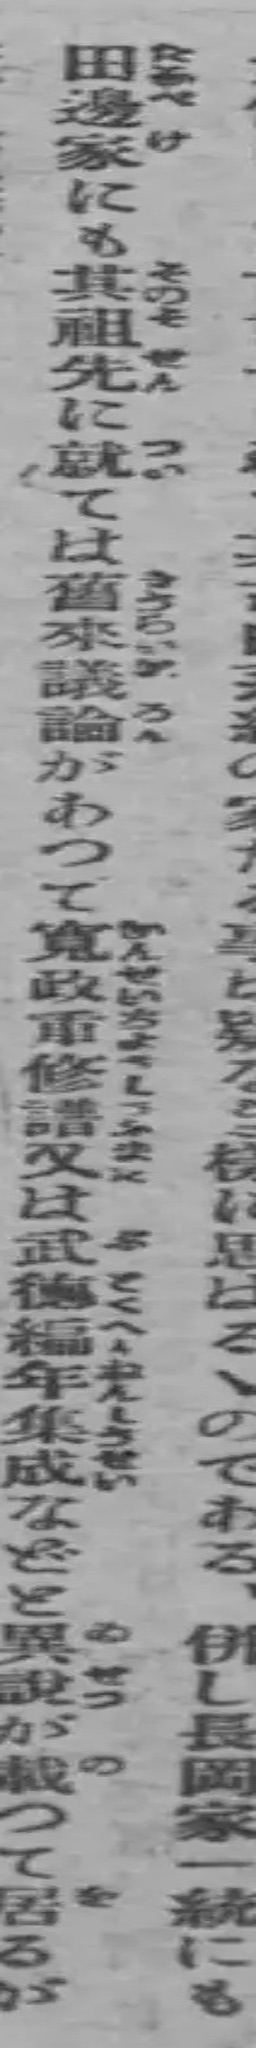田辺家にも其祖先に就ては旧来議論があつて寛政重修譜又は武徳編年集成などと異説が載つて居るが
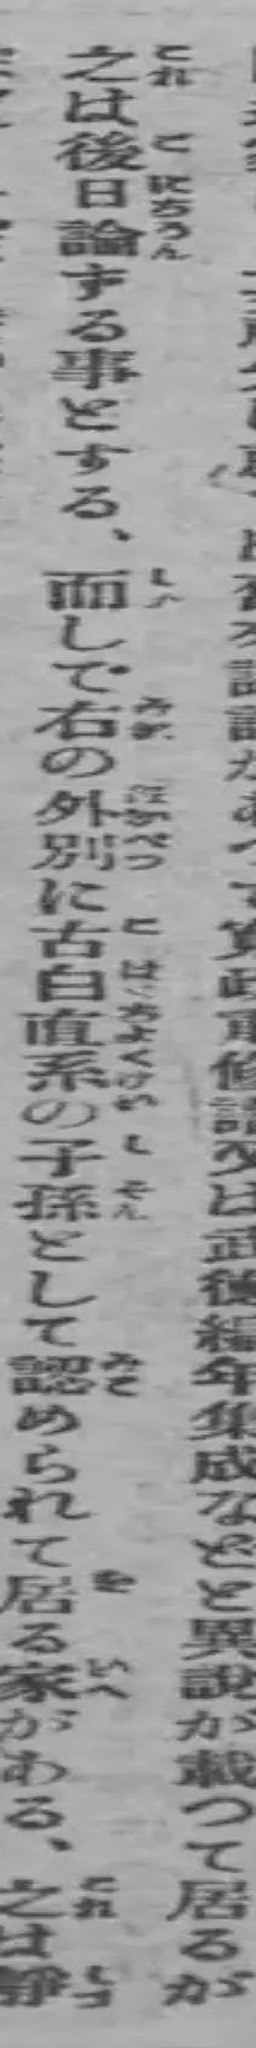之は後日論ずる事とする、而しで右の外別に古白直系の子孫として認められて居る家がある、之は静
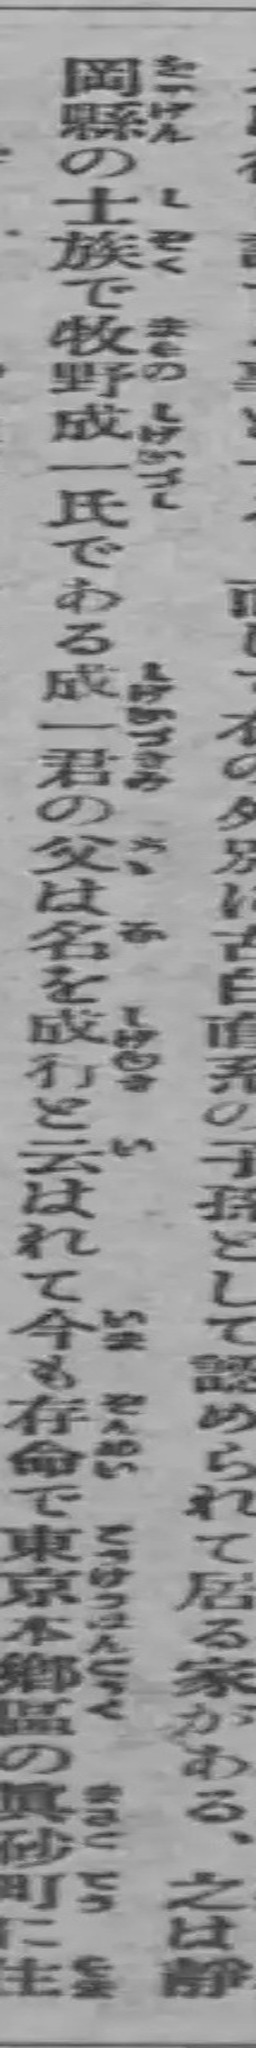牧野成一氏岡県の士族で牧野茂一氏である茂一君の父は名を茂行と云はれて今も存命で東京本郷区の真砂町に住
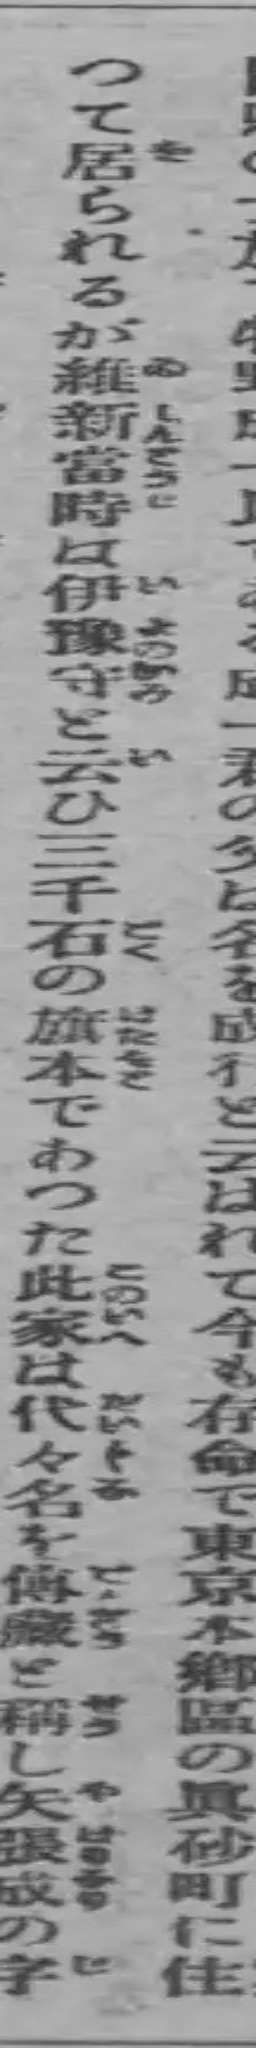つて居られるが維新当時は伊予守と云ひ三千石の旗本であつた此家は代々名を伝蔵と称し矢張成の字
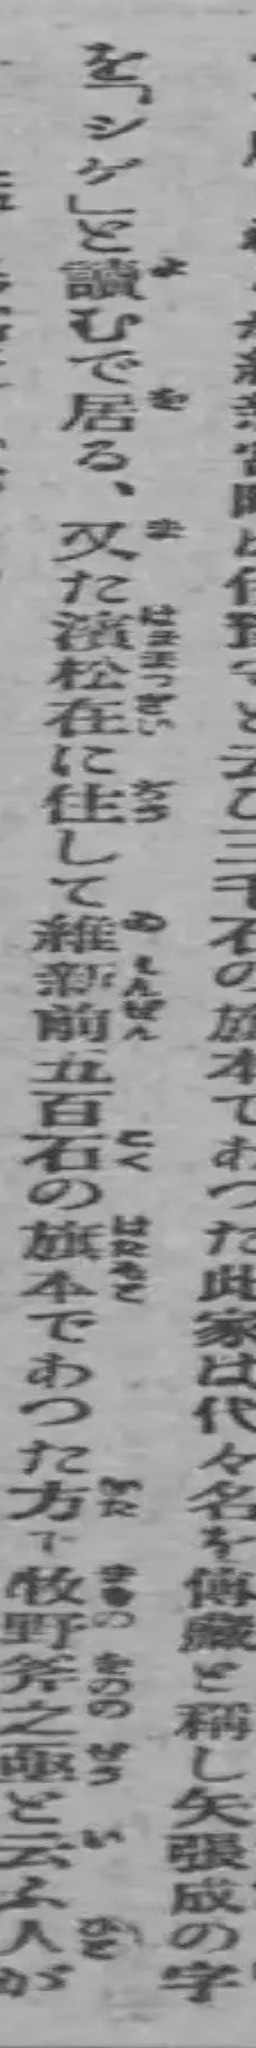を「シゲ」と読むで居る、又た浜松在に住して維新前五百石の旗本であつた方で牧野斧之丞と云ふ人が
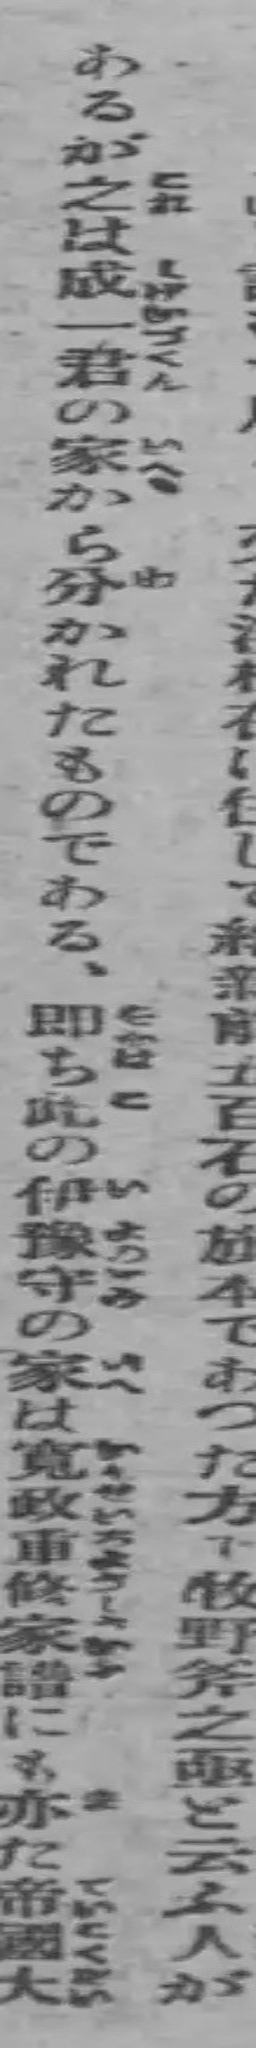あるが之は成一君の家から分かれたものである、即ち此の伊予守の家は寛政重修家譜にも亦た帝国大

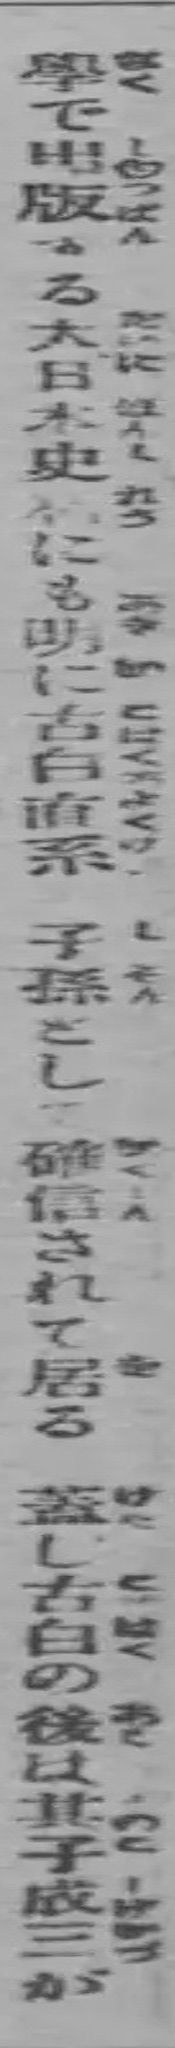学で出版する大日本史料にも明に古白直系の子孫として確信されて居る、蓋し古白の後は其子成三が
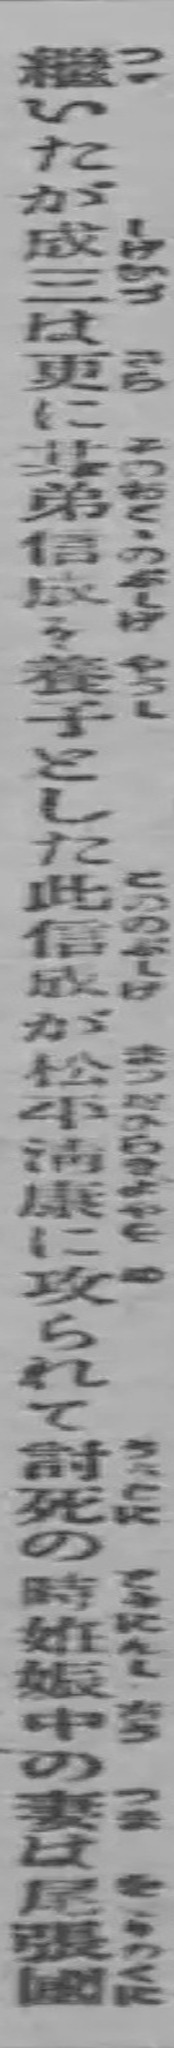継いたが成三は更に其弟信成を養子とした此信成が松平清康に攻られて討死の時妊娠中の妻は尾張国
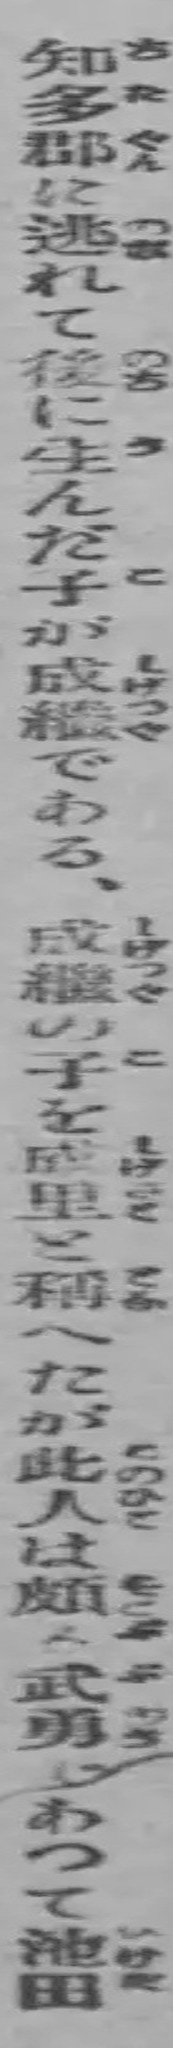知多郡に逃れて後に生んだ子が成継である、成継の子を成里と称へたが此人は頗る武勇であつて池田
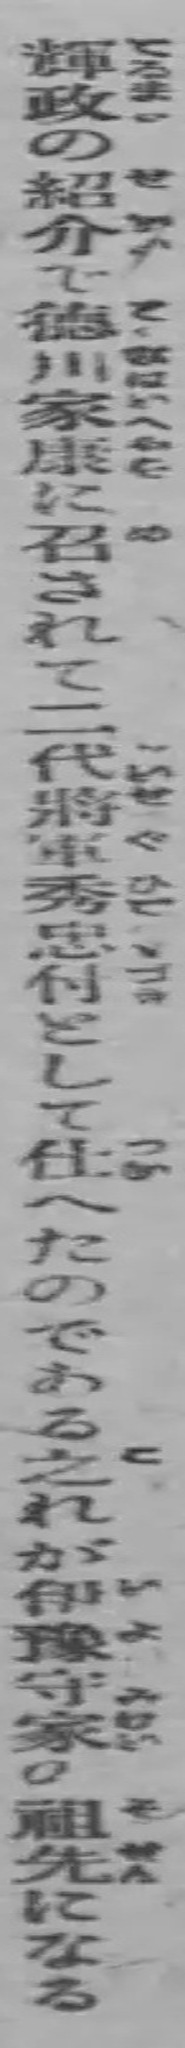輝政の紹介で徳川家康に召されて二代将軍秀忠付として仕へたのである之れが伊予守家の祖先になる
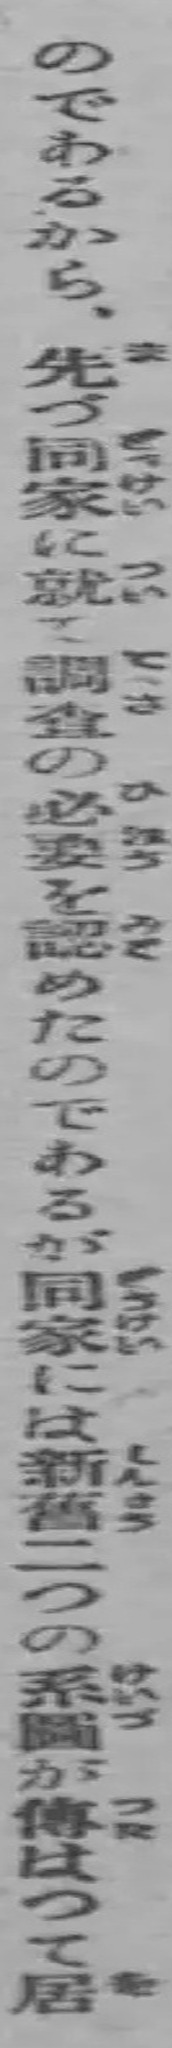牧野系図のであるから、先づ同家に就て調査の必要を認めたのであるが同家には新旧二つの系図が伝はつて居
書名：豊橋市史談
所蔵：国立国会図書館 National Diet Library, JAPAN
